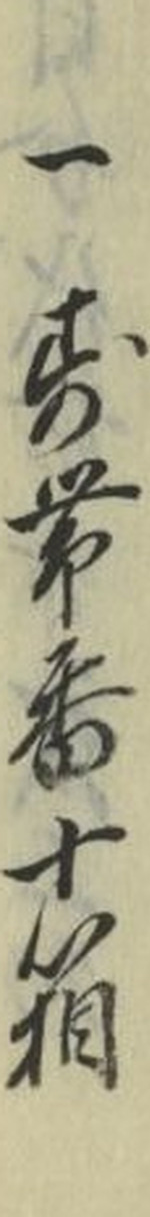一寿帯香十箱
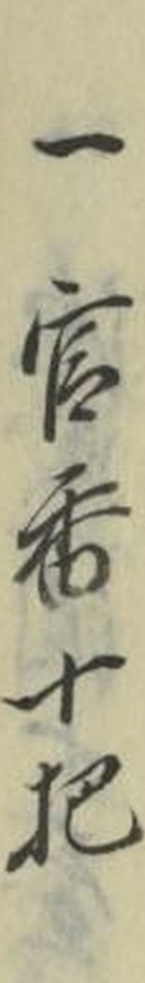一官香十把
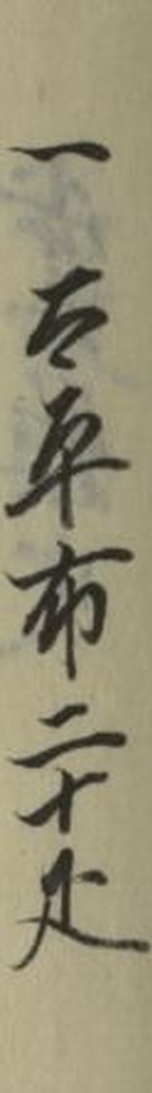一太平布二十疋
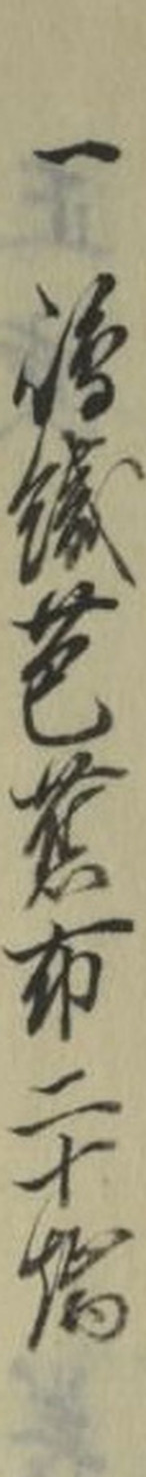一嶋織芭蕉布二十端
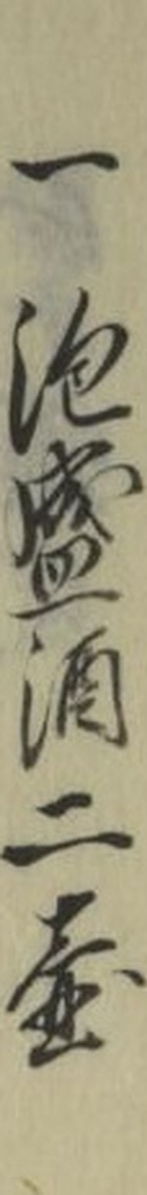一泡盛酒二壺
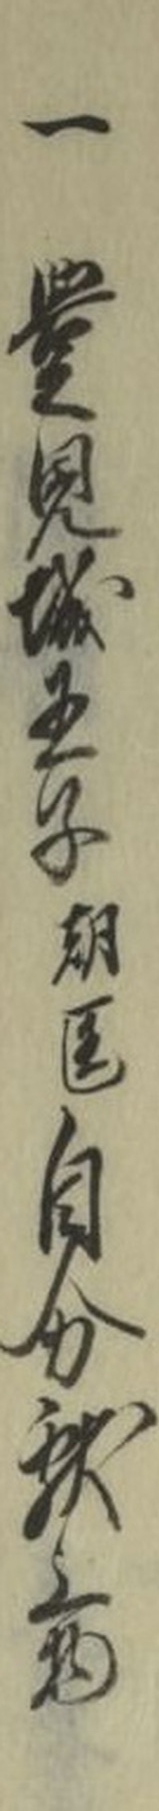一豊見城王子朝臣自分献上物
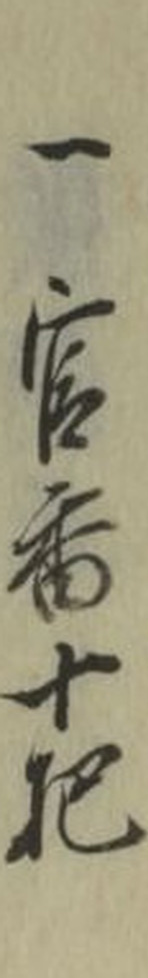一官香十把
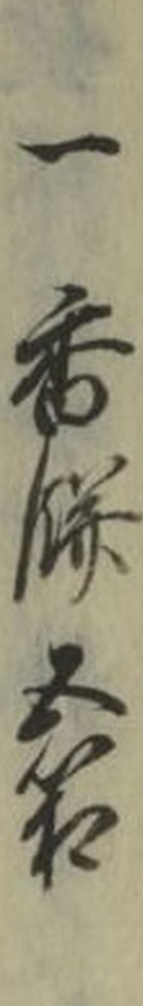一香餅五箱
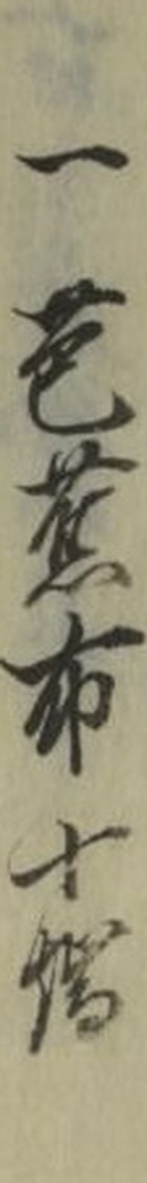一芭蕉布十端
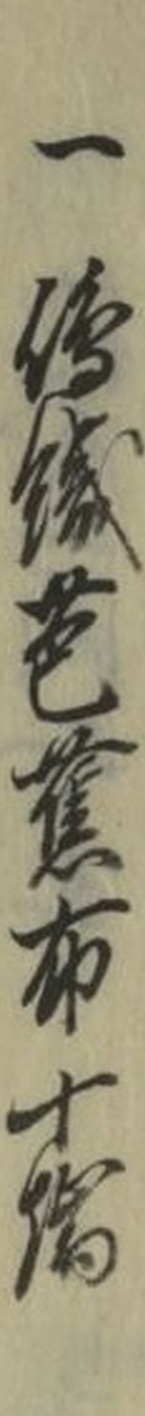一嶋織芭蕉布十端

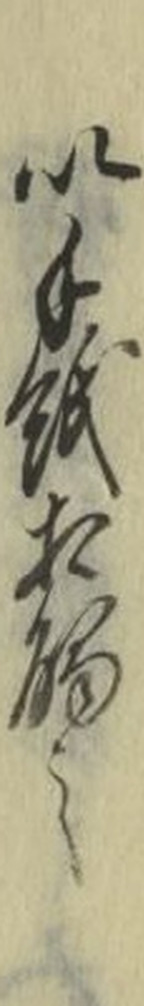以手紙相触之
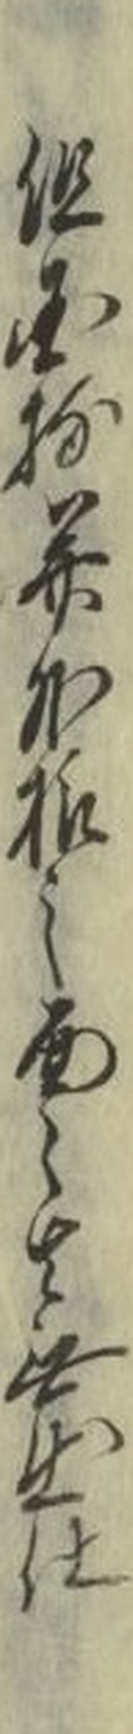但国持并外様之面々は無出仕
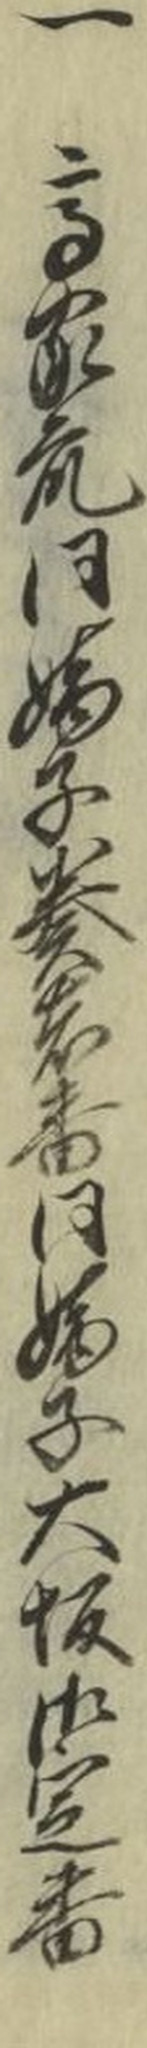一高家衆同嫡子奏者番同嫡子大坂御定番
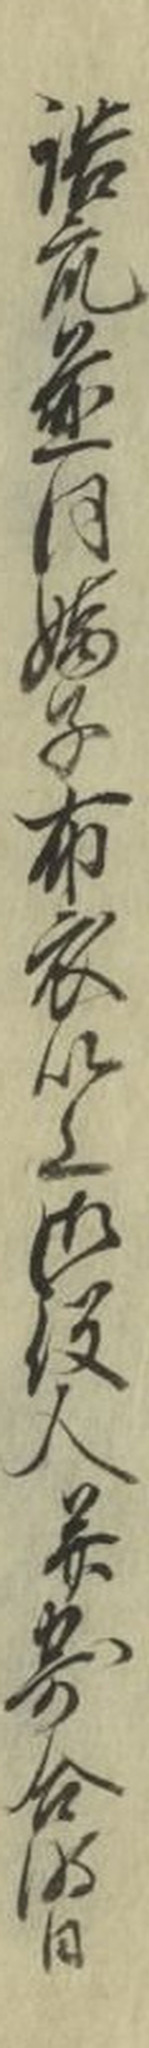詰衆並同嫡子布衣以上御役人并寄合明日
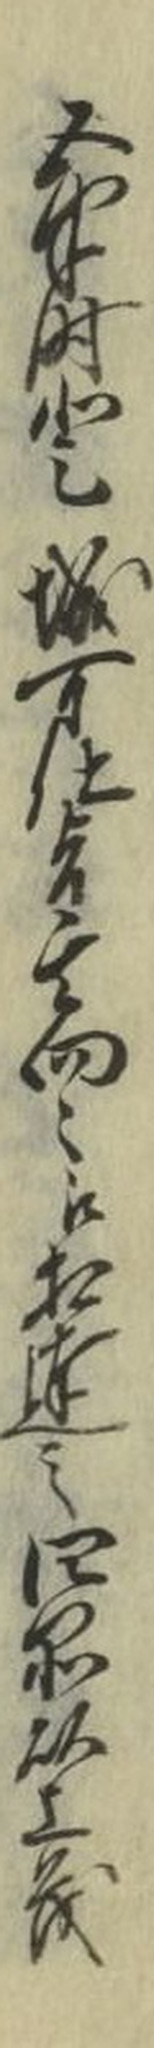五半時登城可仕旨其向々え相達之四品以上も
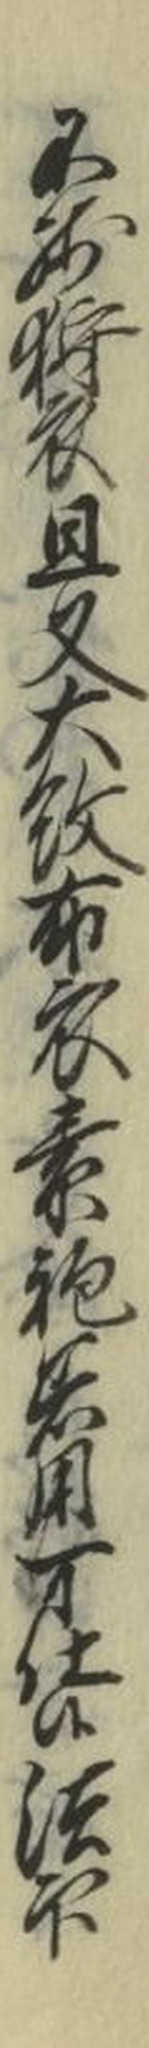不残狩衣且又大紋布衣素袍着用可仕候法印
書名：琉球人参府記
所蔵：University of the Ryukyus Library
